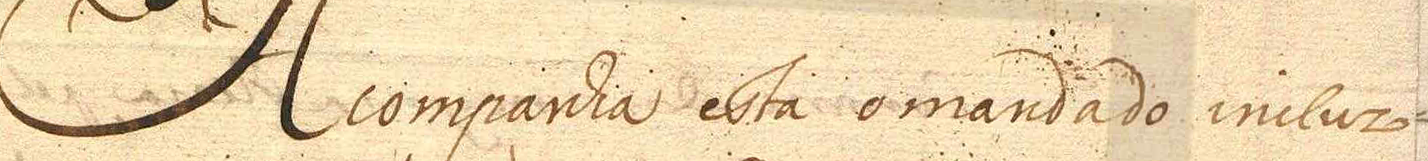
Acompanha esta o mandado incluzo
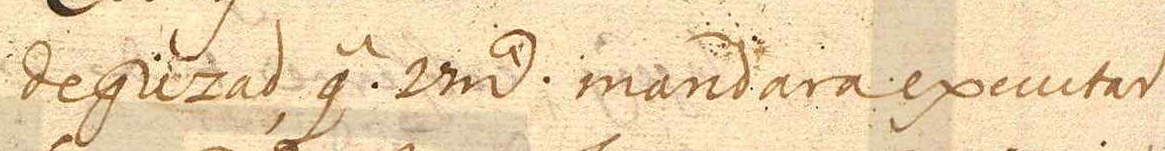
de prizaõ, q̄. v mce. mandara executar
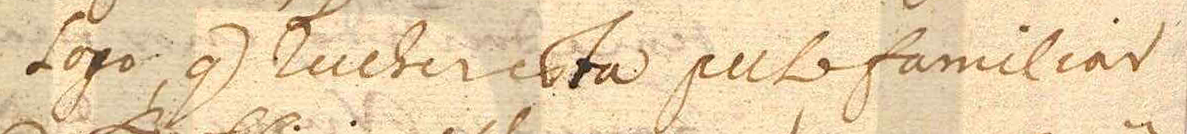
Logo q̄ Receber esta pello familiar
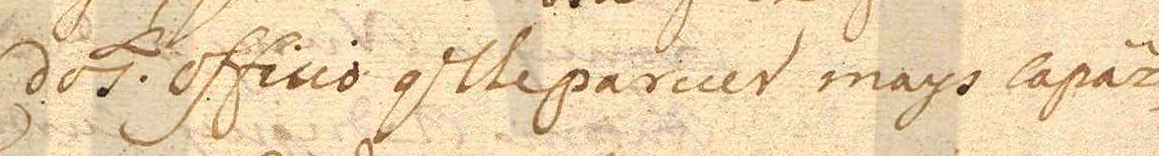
do s.to officio q̄ lhe parecer mays capâz,
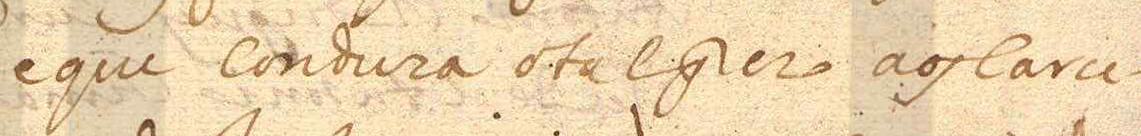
e que conduza o tal prezo aos carce
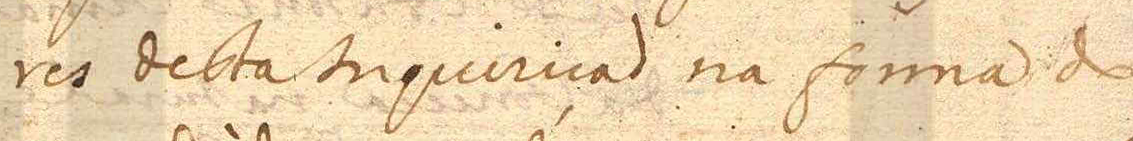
res desta Inquiziçaõ na forma do
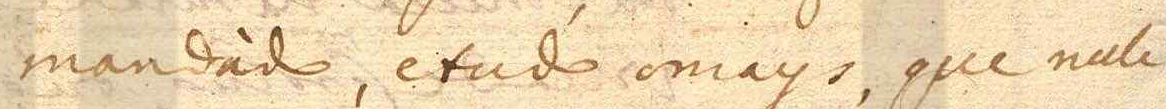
mandàdo, e tudo o mays, que nelle
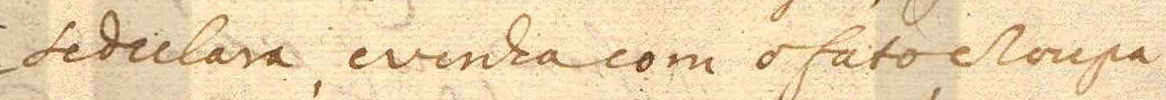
se declara, e venha com o fato e Roupa
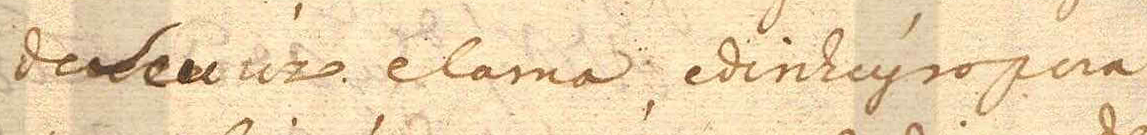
de Seu uzo e cama, e dinheyro pera
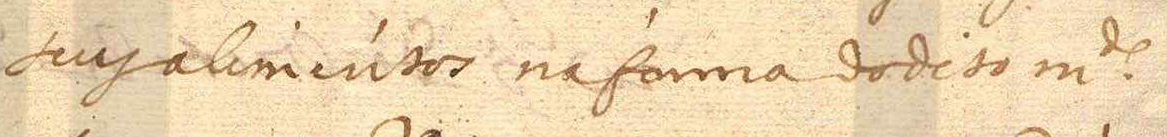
seus alimentos na forma do dito mdo
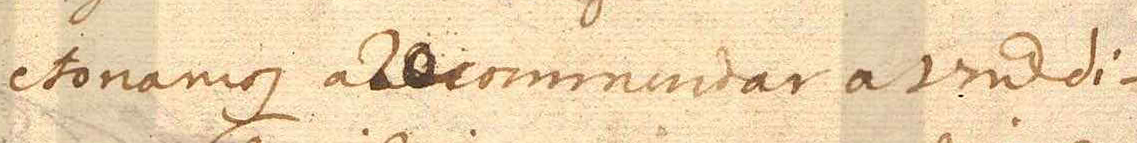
e t̄onamos a Recommendar a v m.ce di
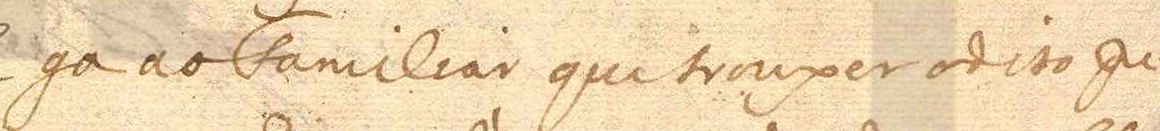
ga ao Familiar que trouxer o dito pre
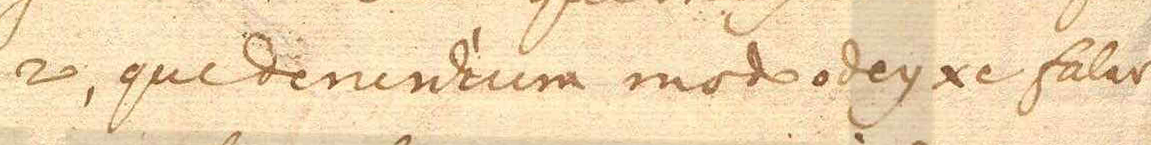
zo, que de nenhum modo o deyxe falar
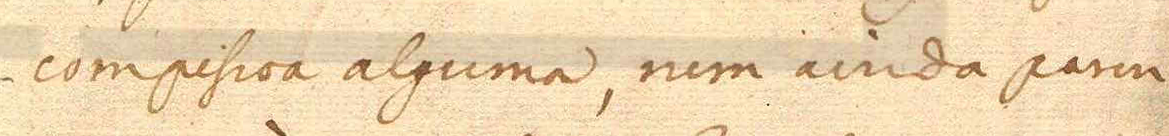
com pessoa alguma, nem ainda paren
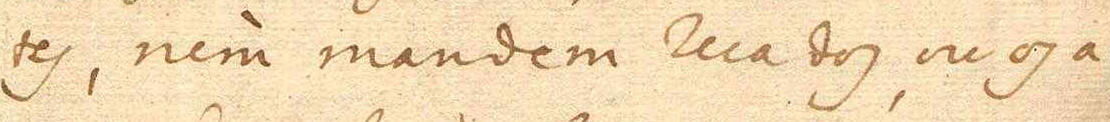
tes, nem mandem Recados, ou os a
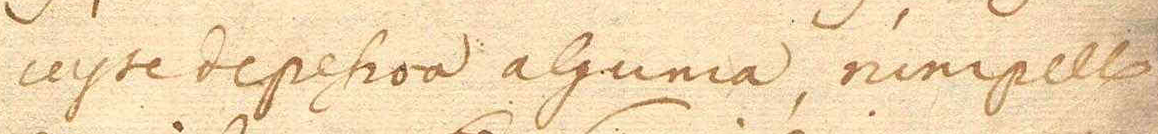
ceyte de pessoa alguma, nem pello
